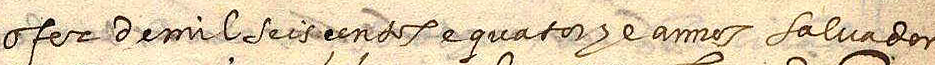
o fez de mil seisçentos e quatorze annos Saluador
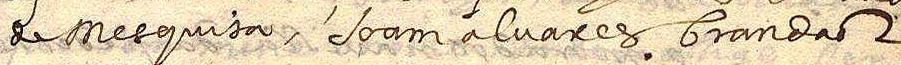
de mesquita, Ioam aluares brandaõ
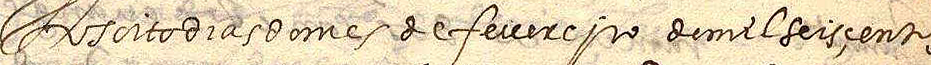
Aos oito dias do mes de feuereiro de mil seisçentos
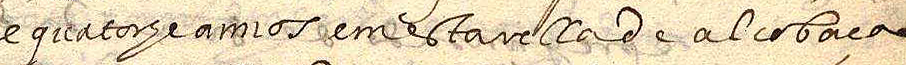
e quatorze annos em esta villa de alcobaça
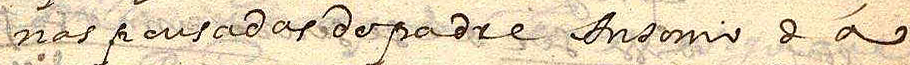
nas pousadas do padre Antonio da
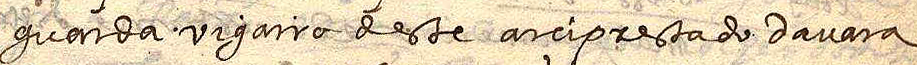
guarda vigairo deste arçiprestado da uara
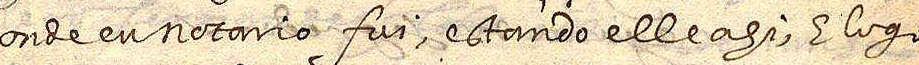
onde eu notario fui, estando elle ahi E logo
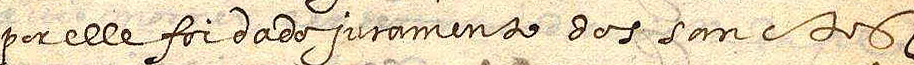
por elle foi dado juramento dos sanctos
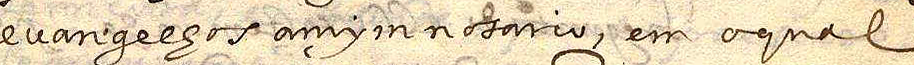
euangelhos a mym notario, em o qual
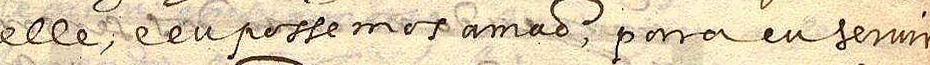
elle, e eu possemos a maõ, para eu seruir
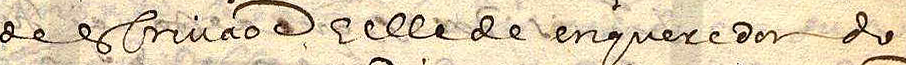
de esCriuaõ E elle de enqueredor do
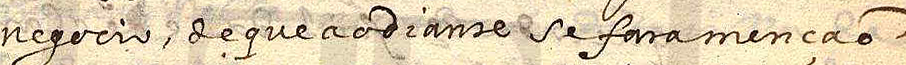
negocio, de que ao diante se fara mençaõ
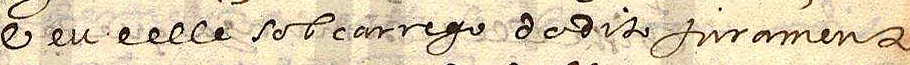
E eu e elle sob carrego do dito juramento
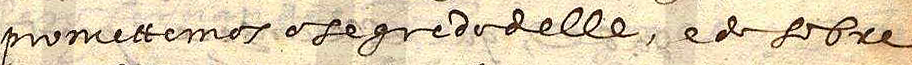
promettemos o segredo delle, e do sobre
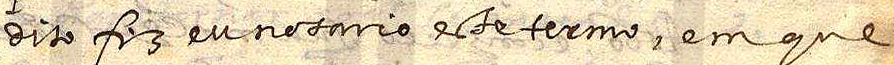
dito fiz eu notario este termo, em que
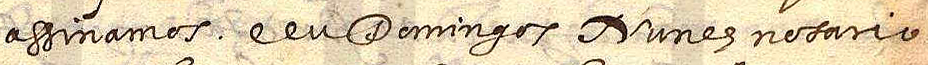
assinamos. e eu Domingos Nunes notario
